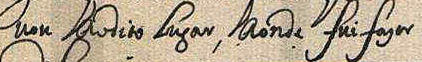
uou o dito lugar, aonde fui fazer
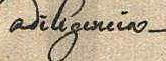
a diligencia
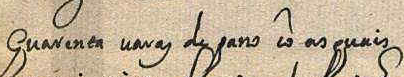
Quarenta uaras de pano cō as quais
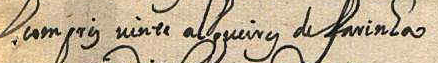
comprej uinte alqueires de farinha
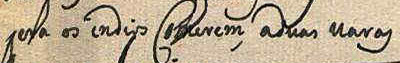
pera os indios Comerem, a duas uaras
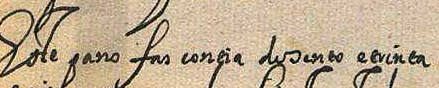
Este pano fas contia de sento e trinta
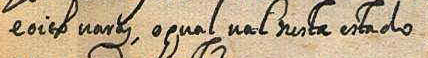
e oito uaras, o qual ual nesta estado
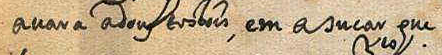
a uara a dous tostoĩs, em asucar, que
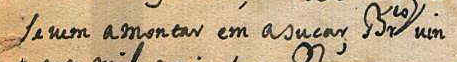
se uem a montar em asucar, Brco uin
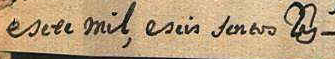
e sete mil, e seissentos Rēs
